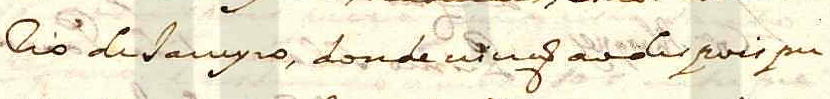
Rio de Ianeyro, donde uiuaõ ao despois pre
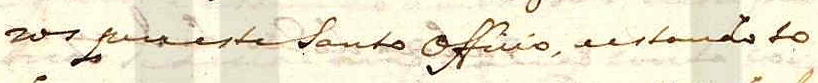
zos pera este Santo officio, e estando to
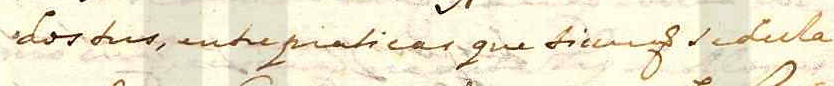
dos tres, entre praticas que tiueraõ se decla
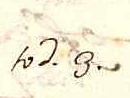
tod. 3.
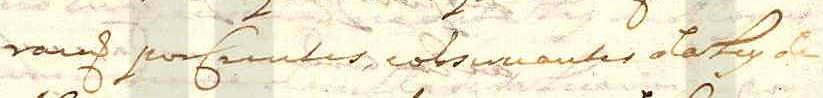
raraõ por Crentes, e obseruantes da Ley de
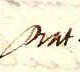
prat.
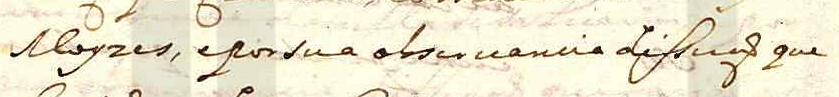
Moyzes, e por sua obseruancia disseraõ que
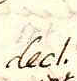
decl.
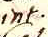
int.
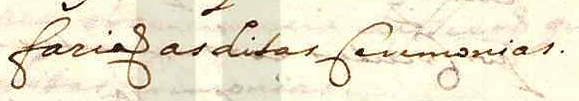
faziaõ as ditas Ceremonias.
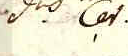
d.as Cer.
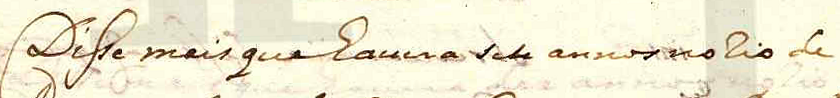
Disse mais que hauera sete annos no Rio de
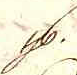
tpō.
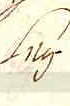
Lug.
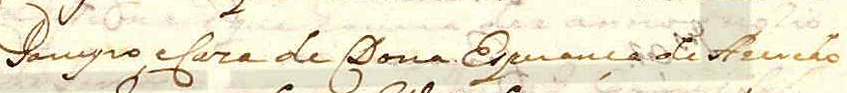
Ianeyro, e Caza de Dona Esperança de Azeuedo
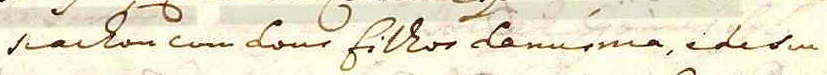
se achou com dous filhos da mesma, e de seu
